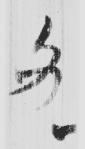力
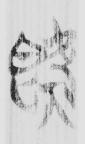{既火}
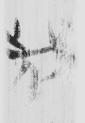戚
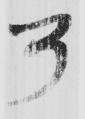乃
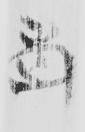老
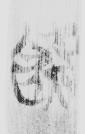{既火}
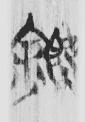{余既火}
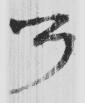乃
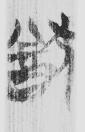猶
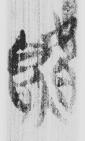{既火}
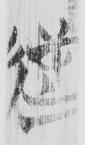逆
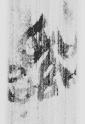{𤔔㗊}
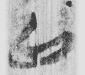㠯（以）
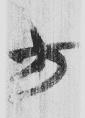方
